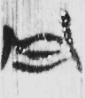丹
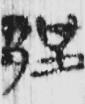郢
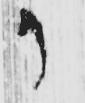人
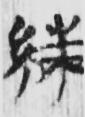絑
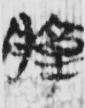○（墙）
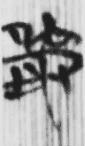襄
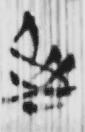侄
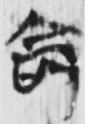命
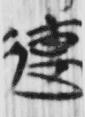連
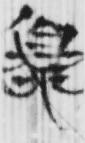囂
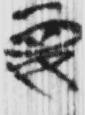妾
